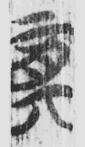奠（郑）
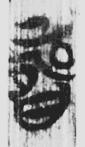寿
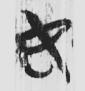女（如）
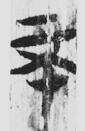不
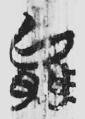能
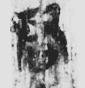君
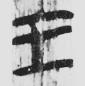王
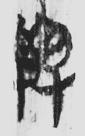與
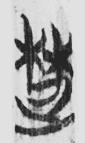楚
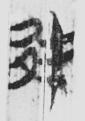邦
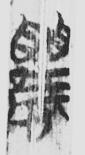懼
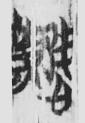戁（难）
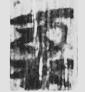奠（郑）
